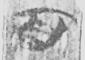百
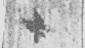十
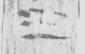三
